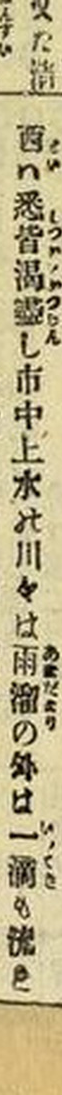西は悉皆渇盡し市中上水の川々は雨溜の外は一滴も流れ
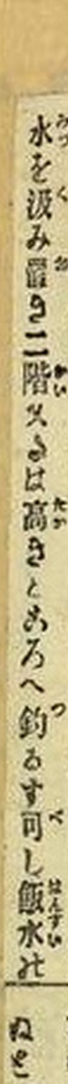水を汲み置き二階又たは高きところへ釣るす可し飯水の
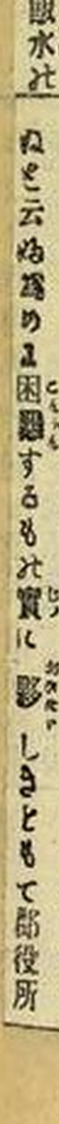ぬと云ふ爲めに困艱するもの實に夥しきをもて郡役所
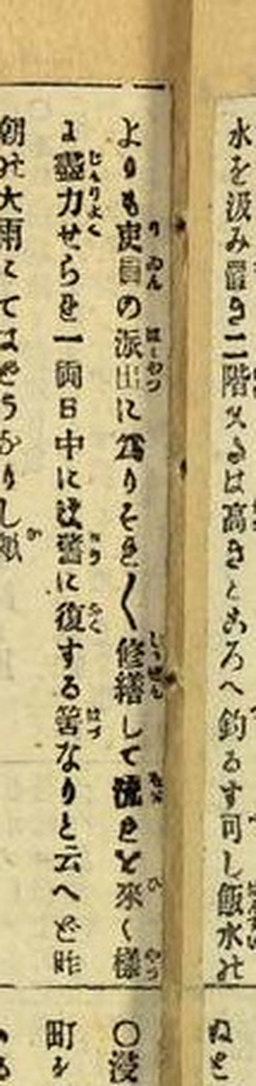よりも吏員の派出に爲りそれ〳〵修繕して流れを來く樣
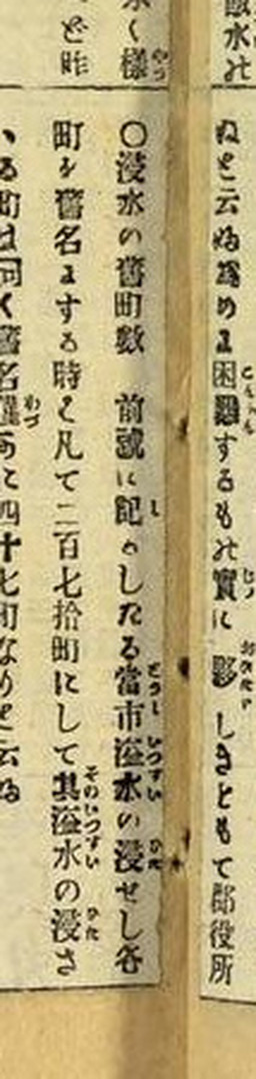○浸水の舊町數前號に記るしたる當市溢水の浸せし各
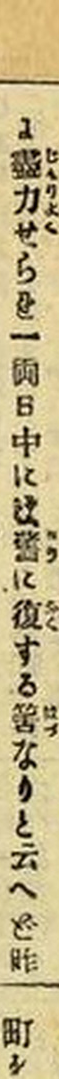に盡力せられ一両日中には舊に復する筈なりと云へど昨
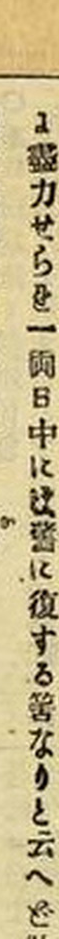に盡力せられ一両日中には舊に復する筈なりと云へど昨
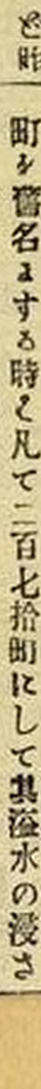町を舊名にする時は凡て二百七拾町にして其溢水の浸さ
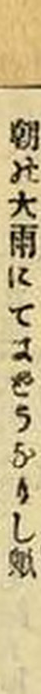朝の大雨にてはどうなりし歟
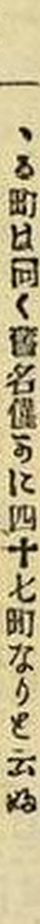ゝる町は同く舊名僅かに四十七町なりと云ふ
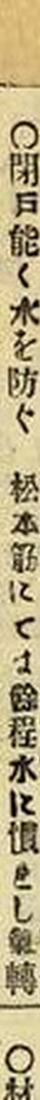○閉戸能く水を防ぐ松本筋にては餘程水に慣れし氣轉
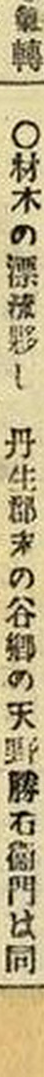○材木の漂流夥し丹生郡末の谷郷の天野勝右衞門は同
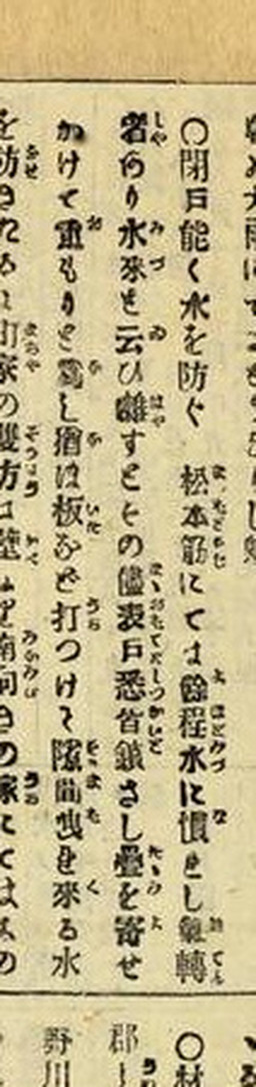者あり水來と云ひ囃すとその儘表戸悉皆鎖さし疂を寄せ
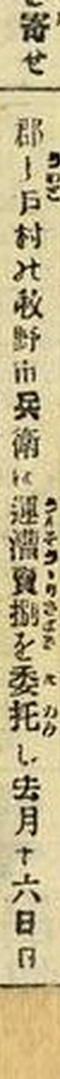郡上戸村の牧野市兵衛に運漕賣捌を委托し去月十六日日
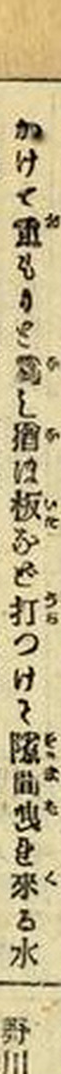かけて重もりと爲し猶ほ板など打つけて隙間洩れ來る水
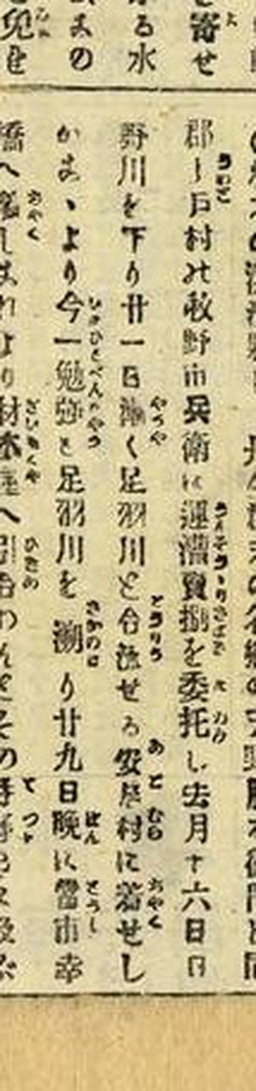野川を下り廿一日漸く足羽川と合流せる安居村に着せし
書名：温古集 五巻
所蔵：福井県文書館 Fukui Prefectural Archives
